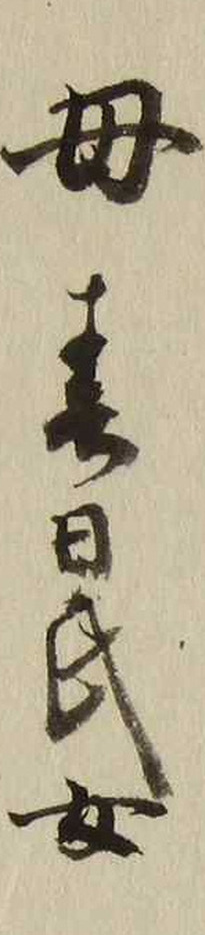母春日氏女

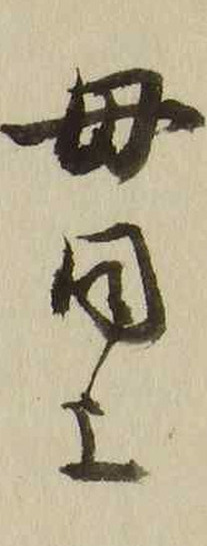母同上
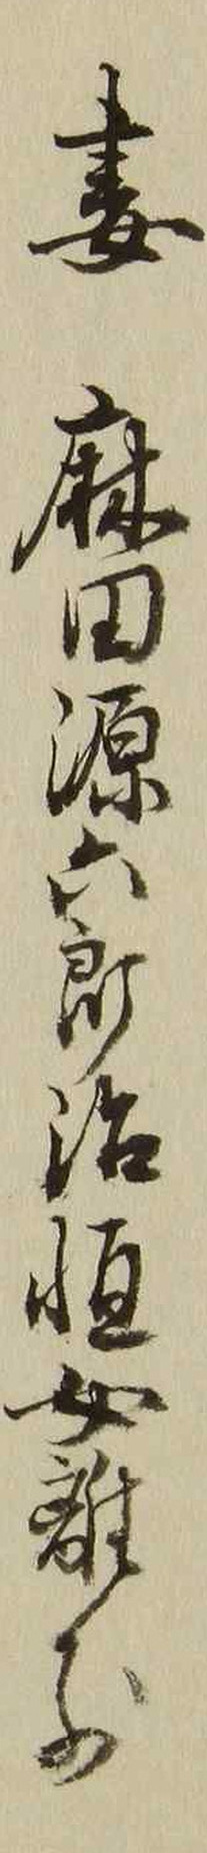妻麻田源六郎治恒女離別
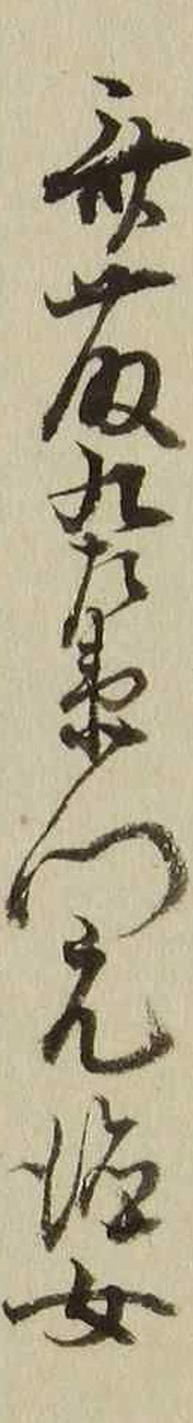斎藤九左衛門元塩女
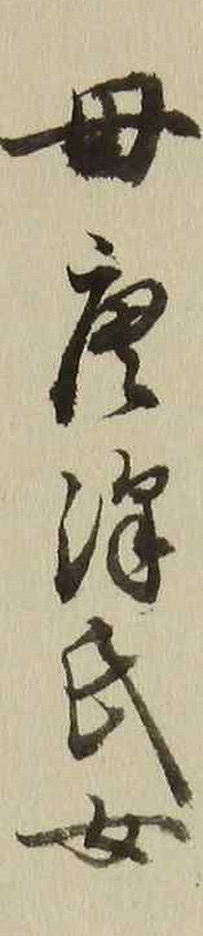母唐沢氏女
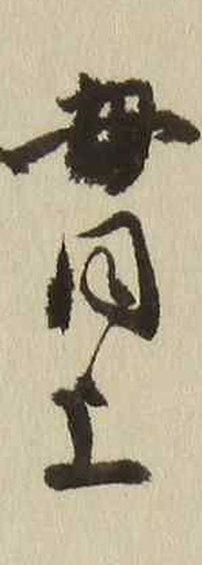母同上
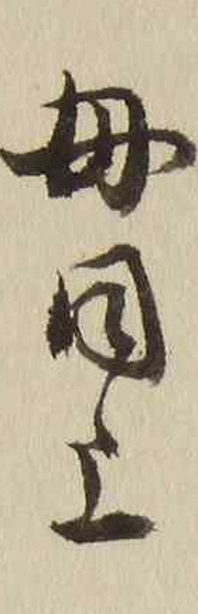母同上

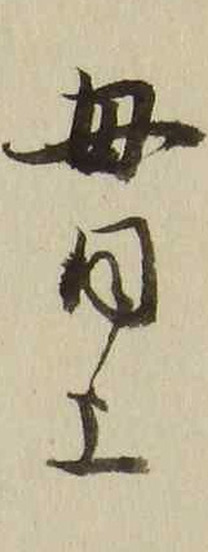母同上
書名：諸士系譜　巻之36　は之部4
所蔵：会津若松市立会津図書館
